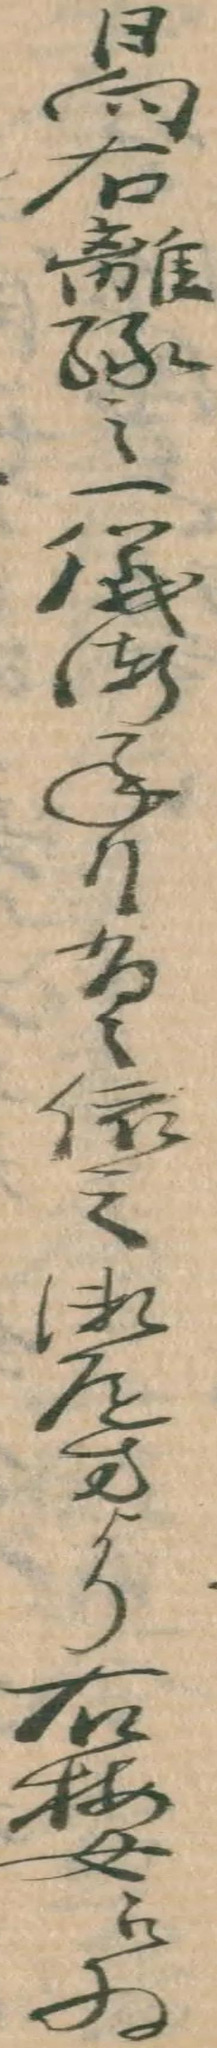日向右離縁之一儀漸承引有之依之瀬尾方より右梅女江為
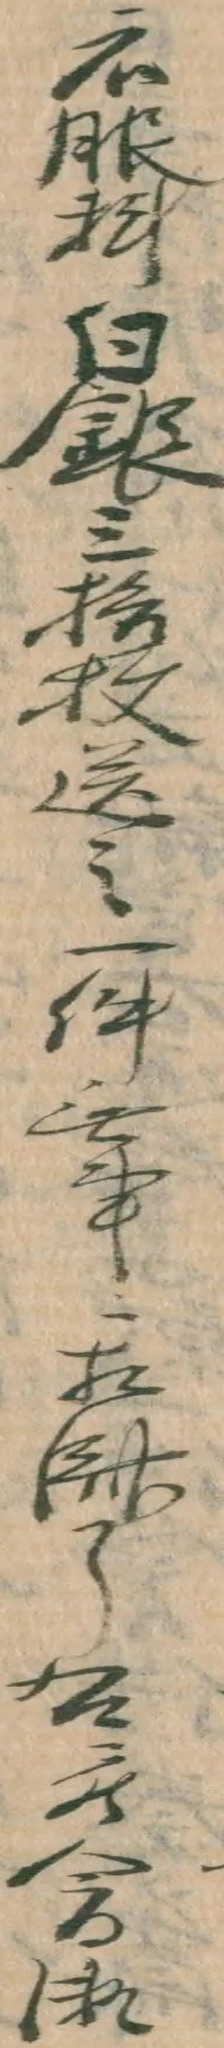衣服掛白銀三拾枚送之一件無事に相済了右ニ付今日瀬
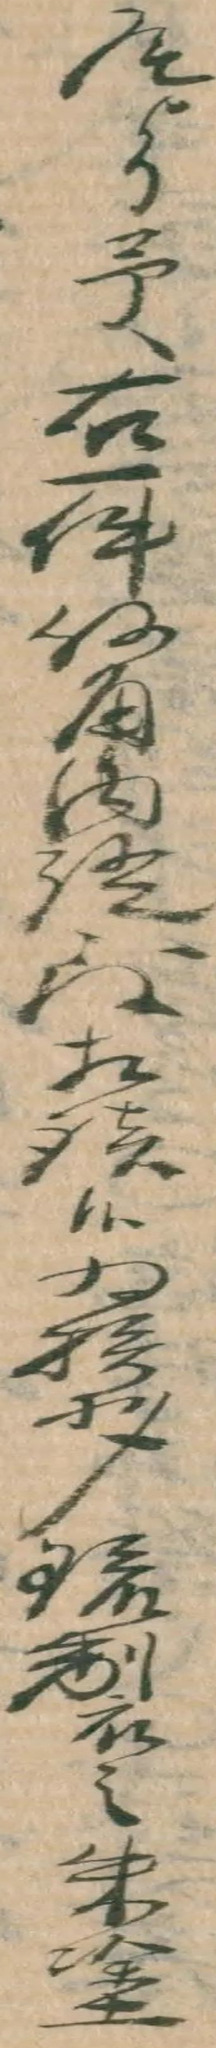尾より予へ右一件何角内證致相談候為挨拶請制ニ候之朱塗
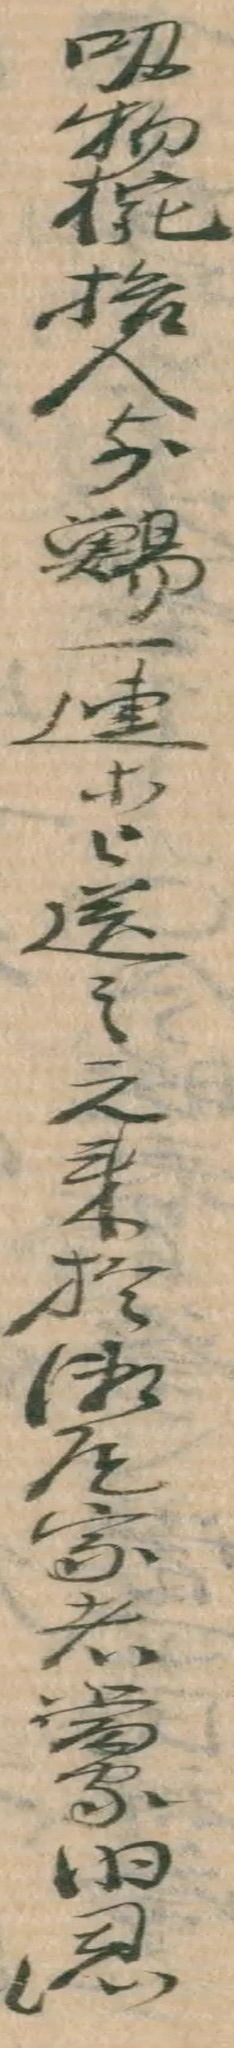吸物椀拾人前鯣一連等被送之元来於瀬尾家者當家旧恩も
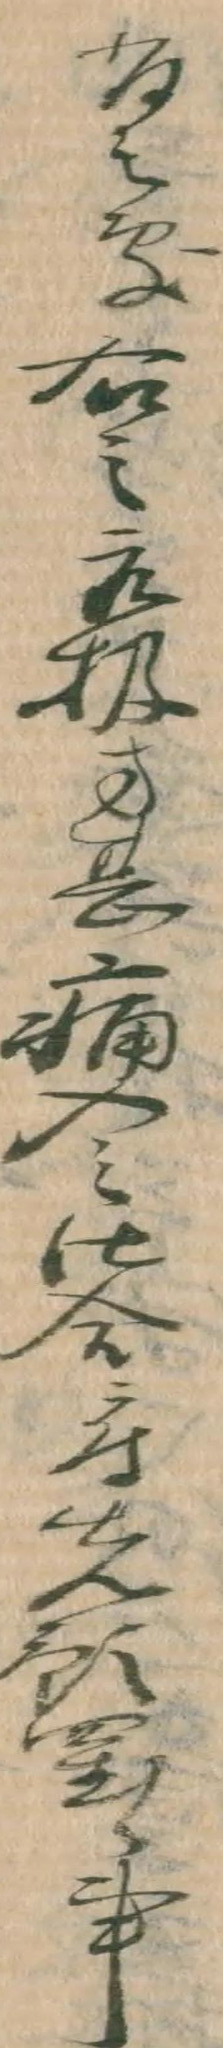有之處右之取扱方甚痛入之仕合ニ付先預置候事
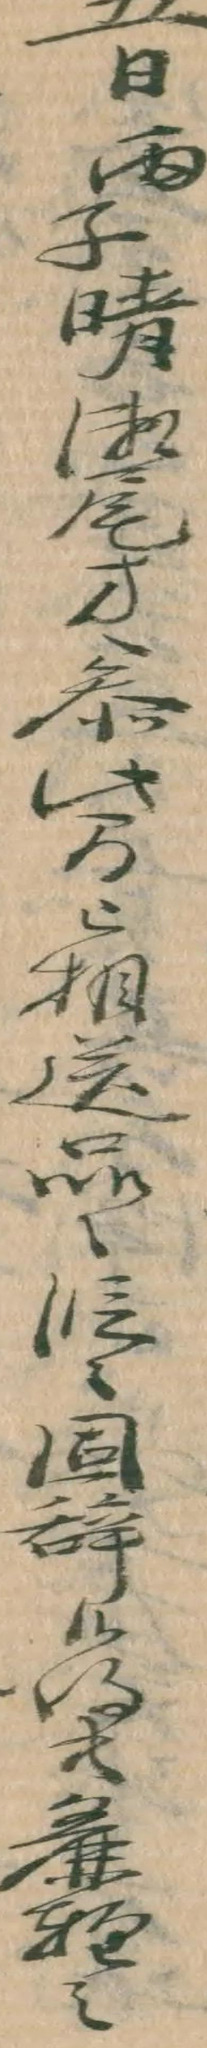五日丙子晴瀬尾方へ参此間被相送品々段々固辞候得共頼之
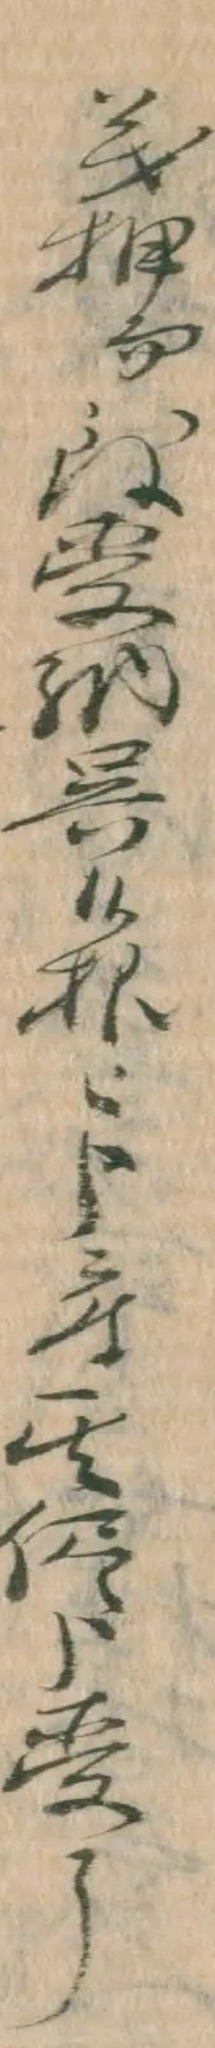義押而致受納呉候様被申ニ付其侭申受了
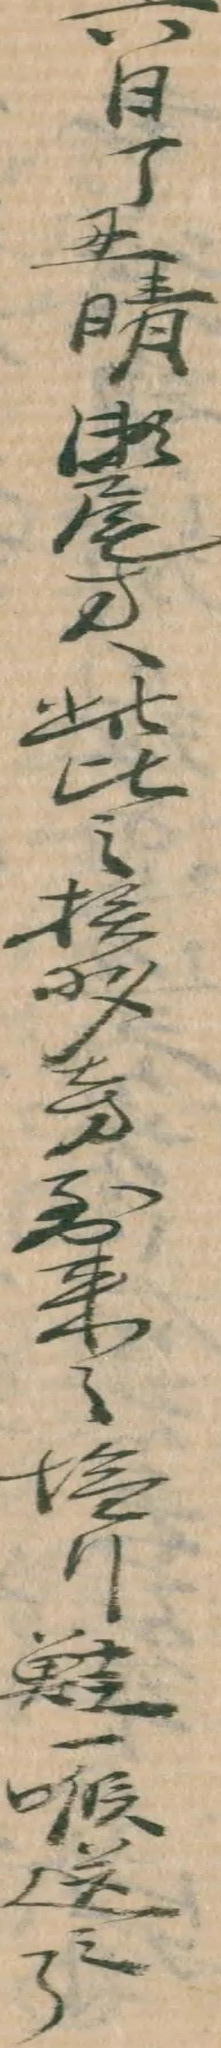六日丁丑晴瀬尾方へ此頃之挨拶旁到来之塩引鮭一喉送之了
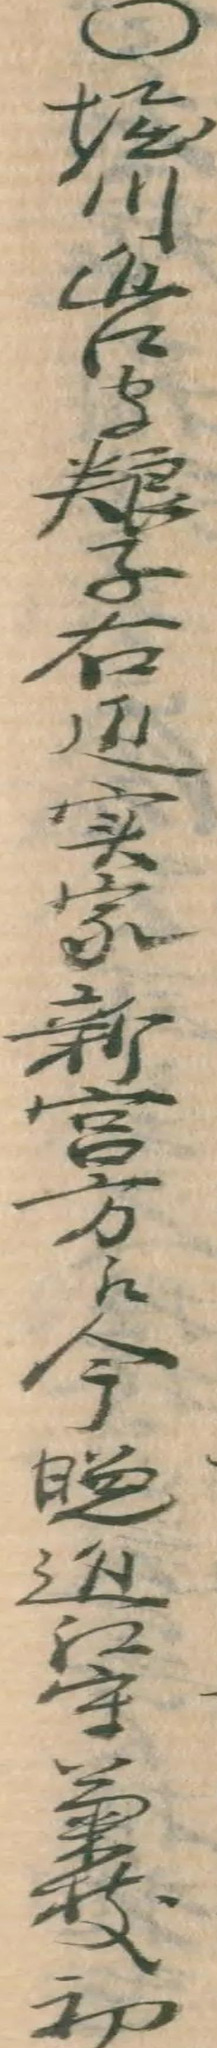○堀川近江守養子右近実家新宮方江今晩近江守兼枝初
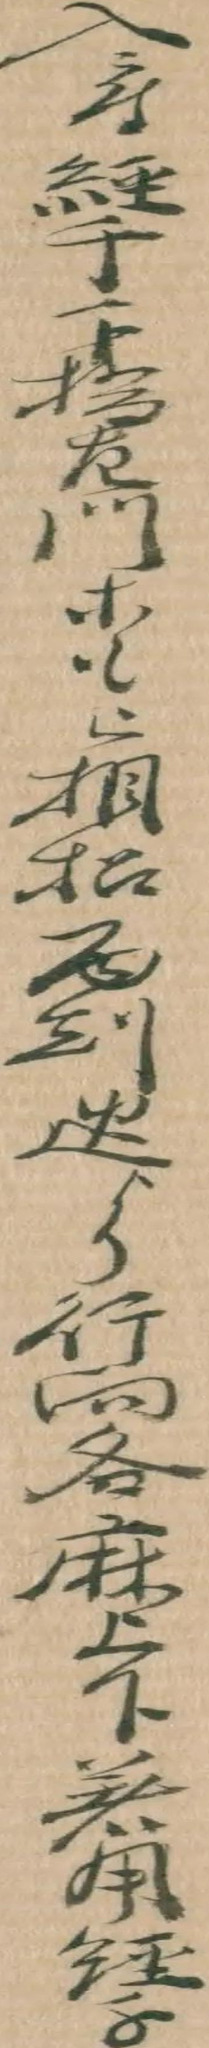入ニ付経千下橋左門等も被相招酉刻辺より行向各麻上下着用経千
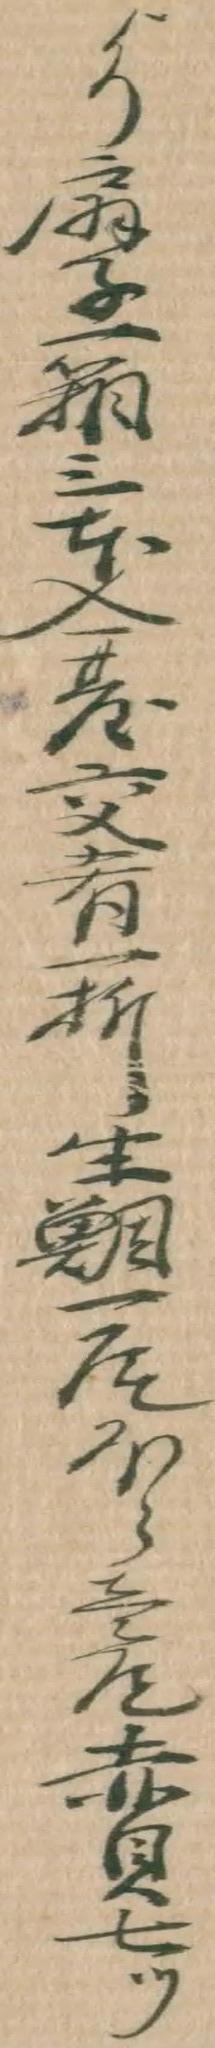より扇子一箱三本入台交肴一折生鯛一尾ほら壱包赤貝七ツ
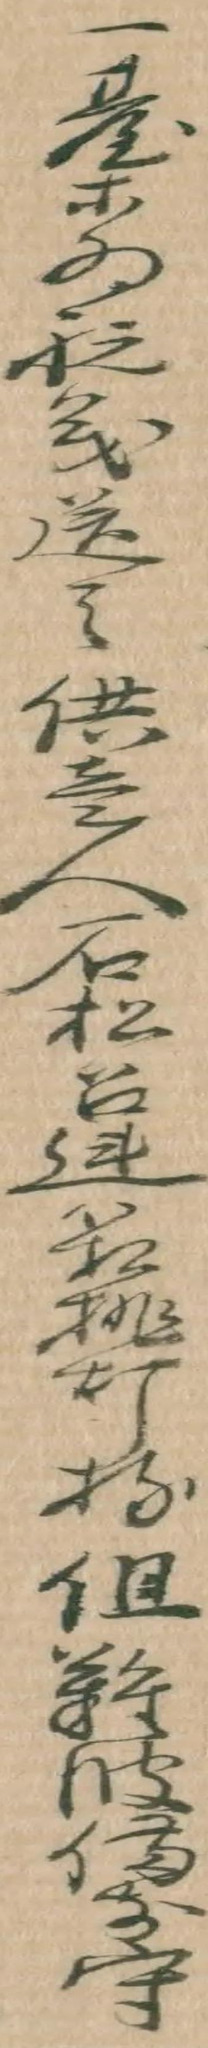一台等為祝義送之供壱人石松召連箱挑灯持但難波備前守
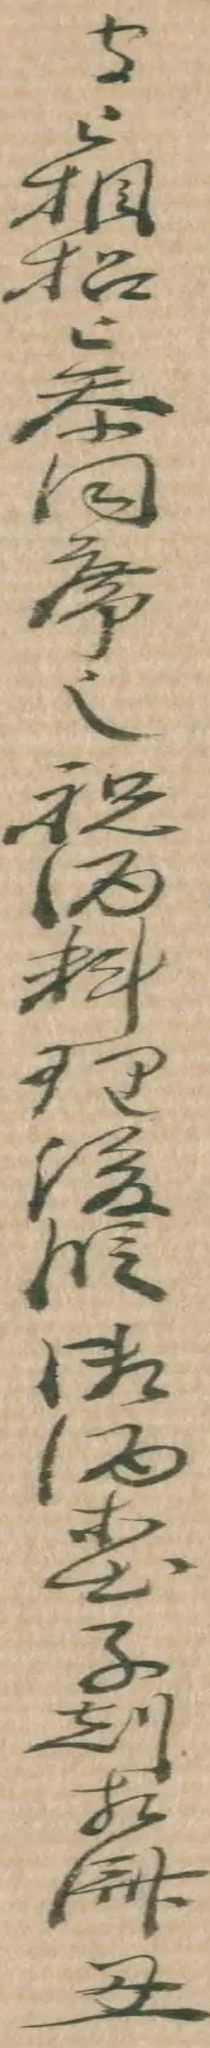守被相招被参同席之祝酒料理後段御酒等出子刻相済丑
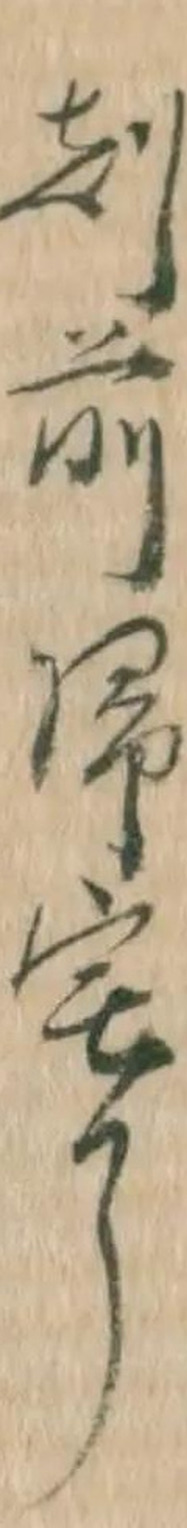刻前帰宅了
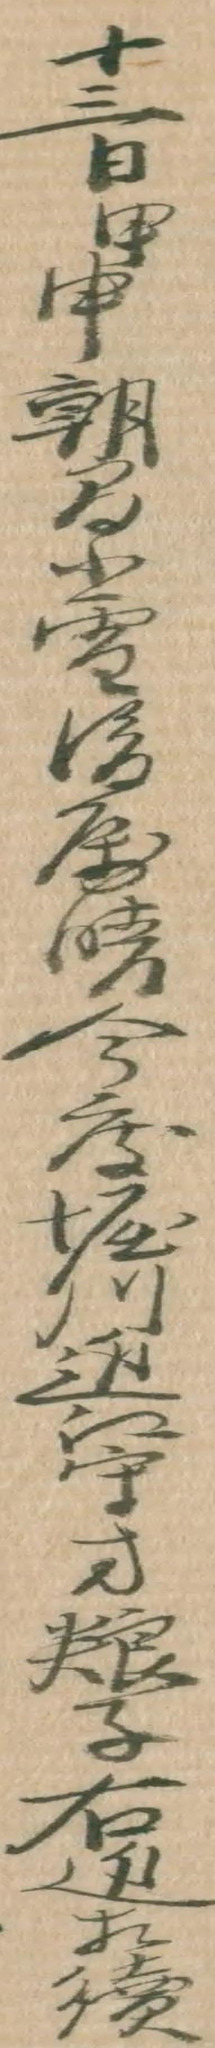十三日甲申朝間小雪後属晴今度堀川近江守方養子右近相續
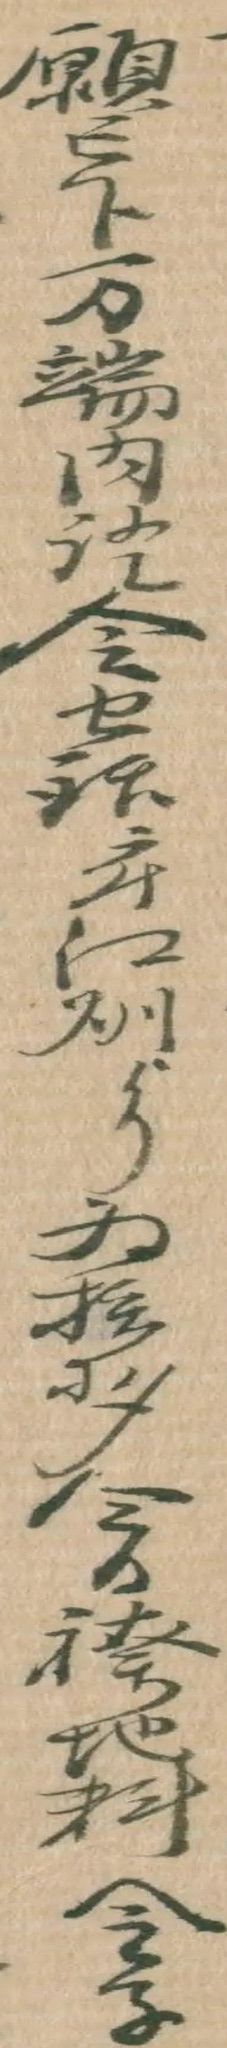願被下万端内證令世話ニ付江州より為挨拶今日袴地料金子
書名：賀茂社記録. 第65冊
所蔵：国立国会図書館 National Diet Library, JAPAN
